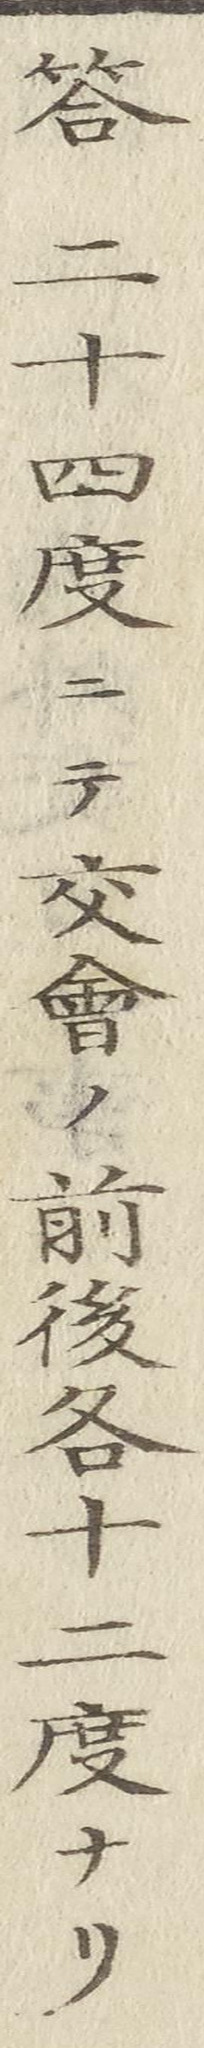答二十四度ニテ交会ノ前後各十二度ナリ

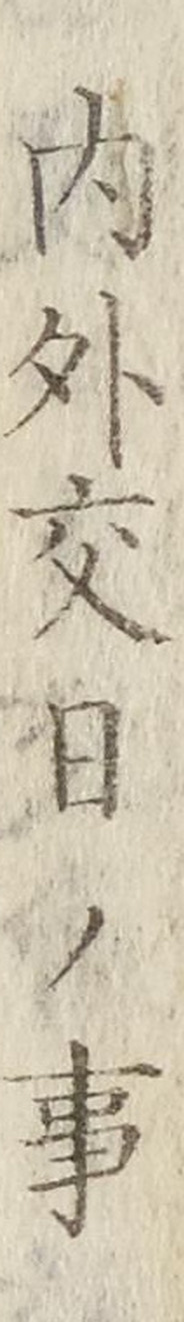内外交日ノ事
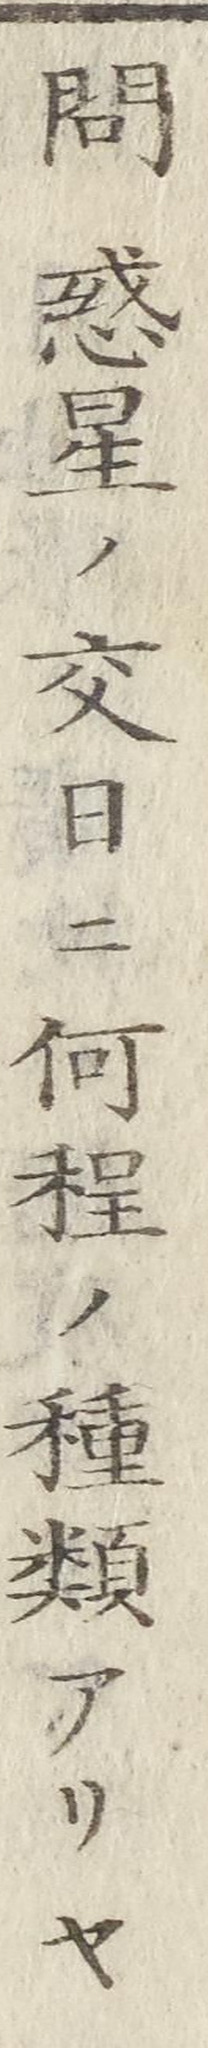問惑星ノ交日ニ何程ノ種類アリヤ
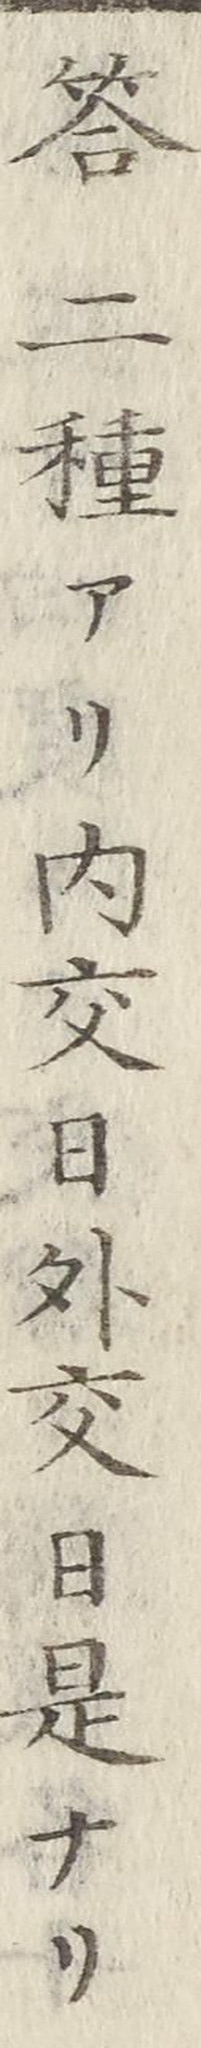答二種アリ内交日外交日是ナリ
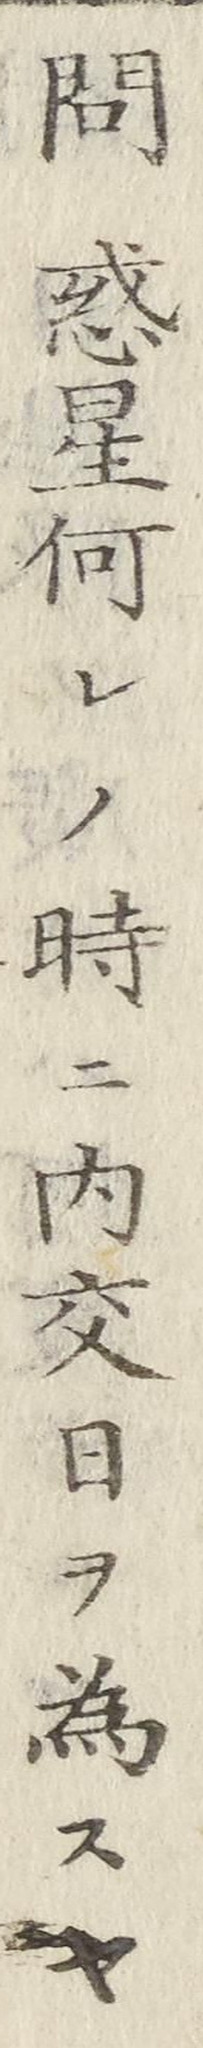問惑星何レノ時ニ内交日ヲ為スヤ
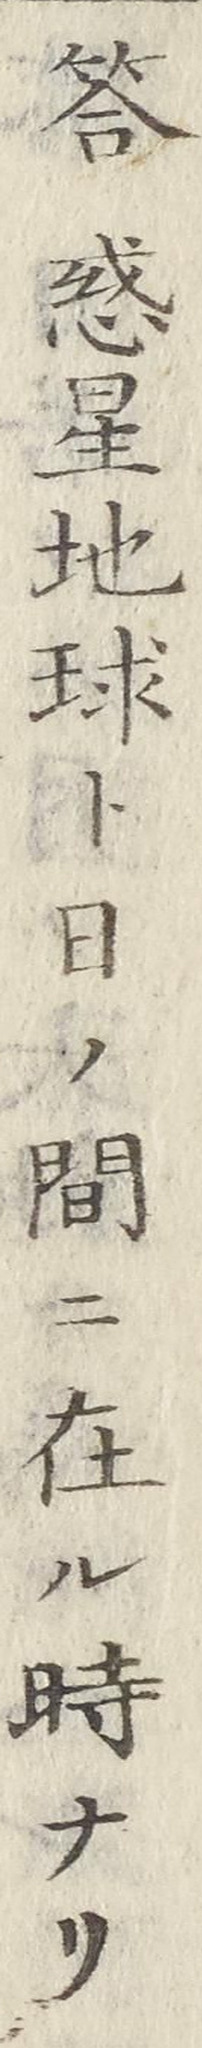答惑星地球ト日ノ間ニ在ル時ナリ
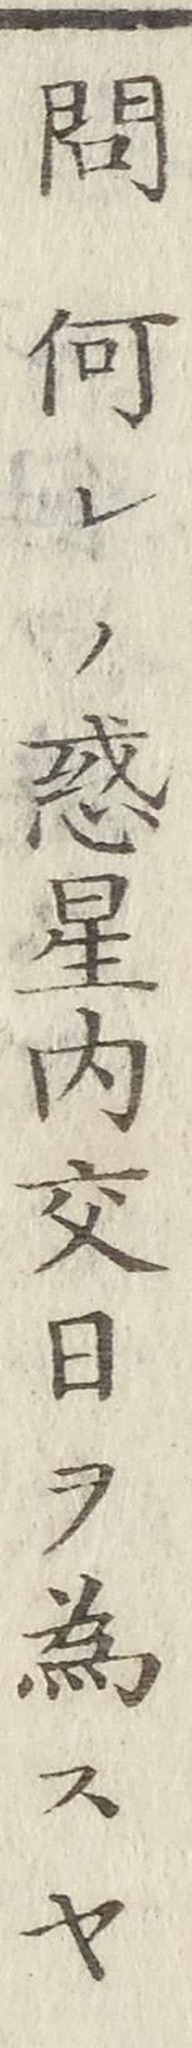問何レノ惑星内交日ヲ為スヤ
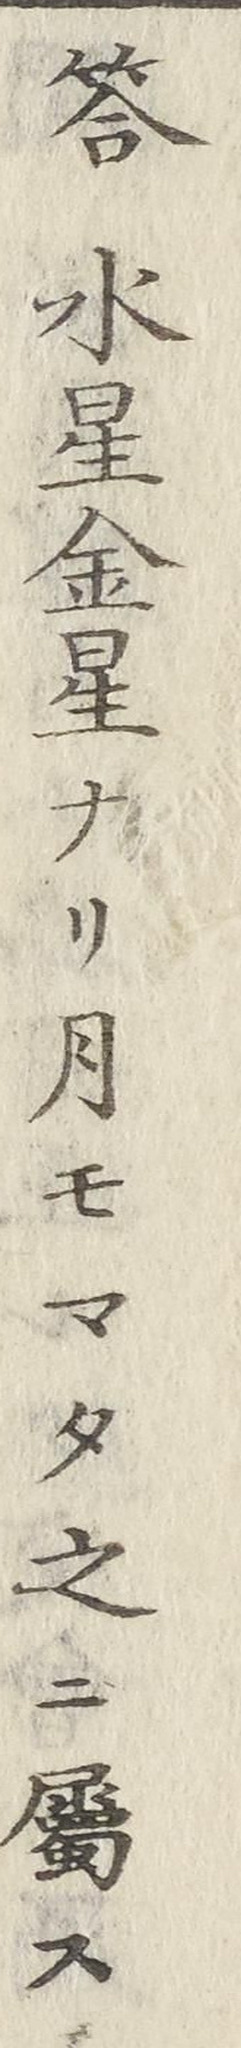答水星金星ナリ月モマタ之ニ属ス
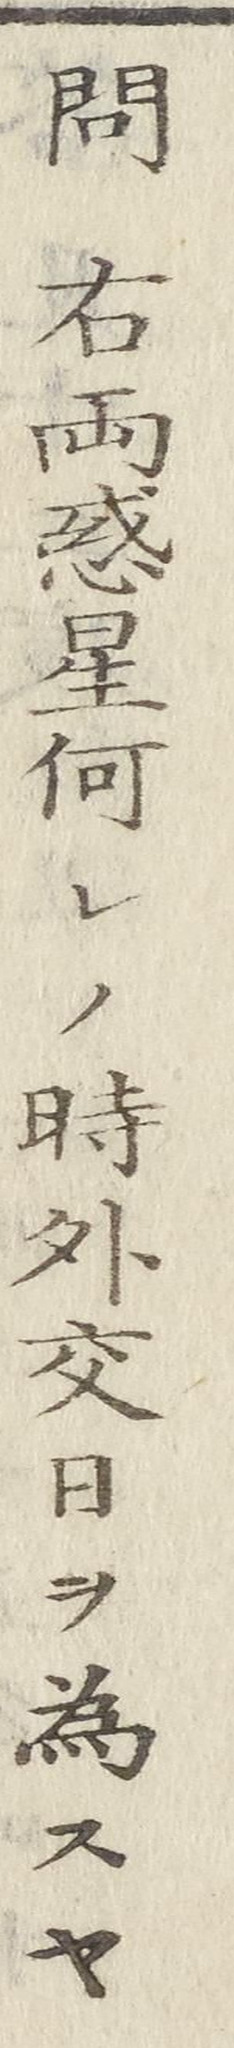問右両惑星何レノ時外交日ヲ為スヤ
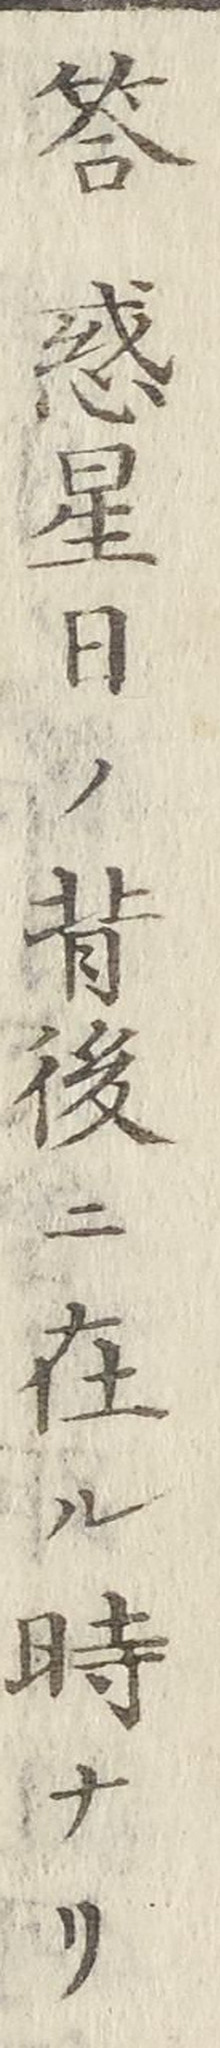答惑星日ノ背後ニ在ル時ナリ
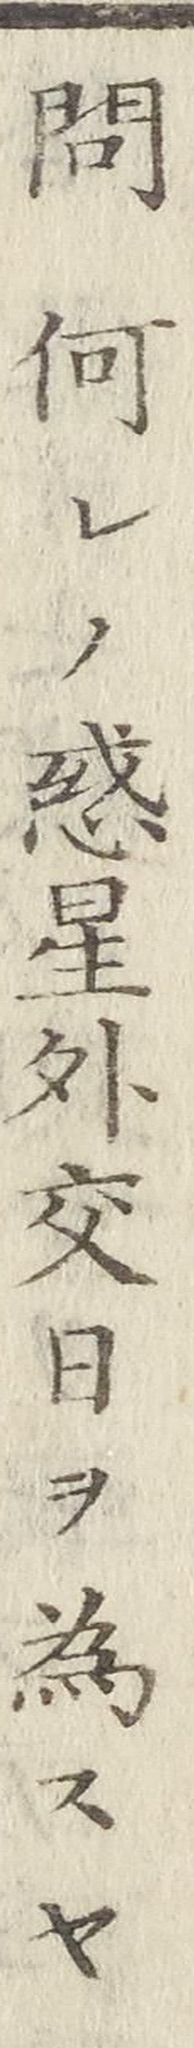問何レノ惑星外交日ヲ為スヤ
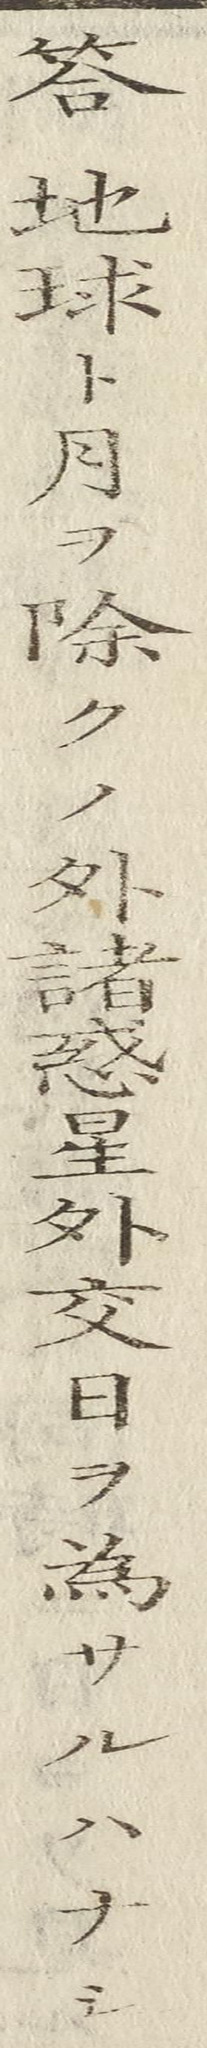答地球ト月ヲ除クノ外諸惑星外交日ヲ為サルハナシ
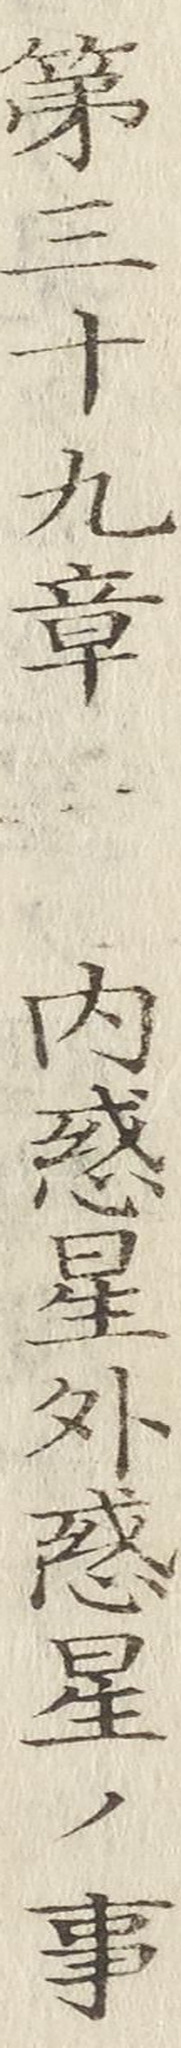第三十九章内惑星外惑星ノ事
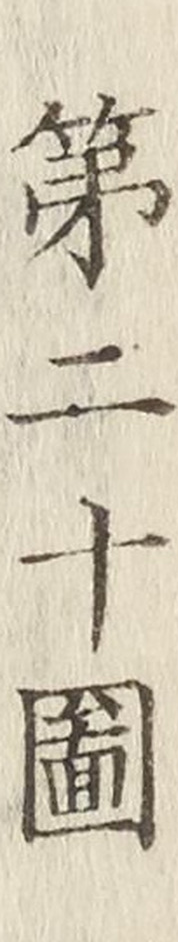第二十図
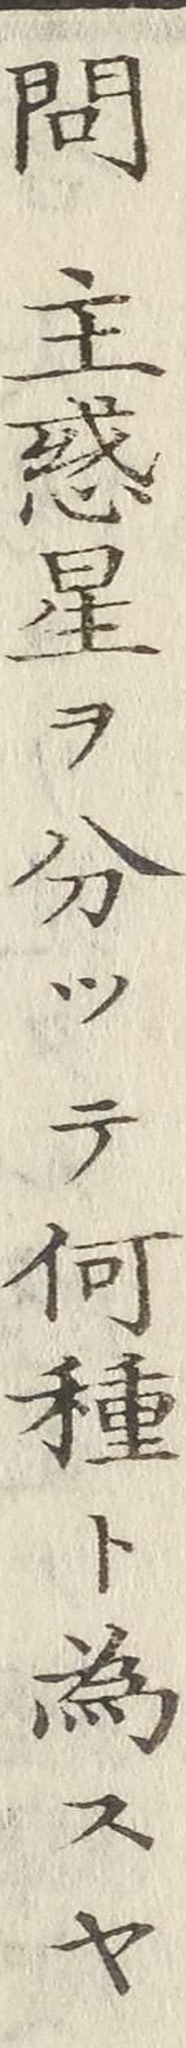問主惑星ヲ分ツテ何種ト為スヤ
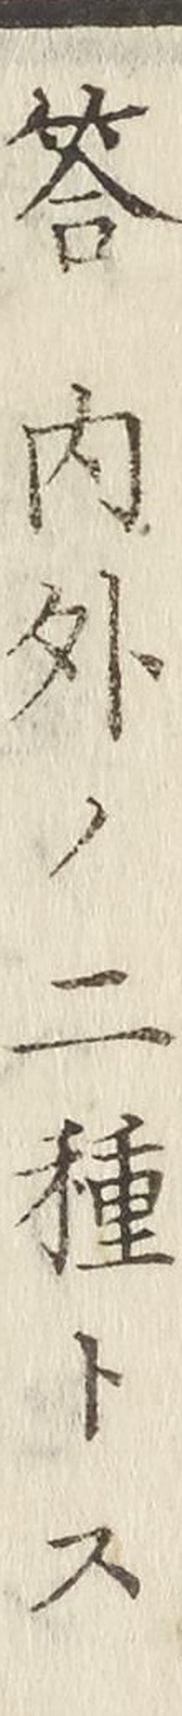答内外ノ二種トス
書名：星学圖説　下
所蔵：東京大学地震研究所図書室 Earthquake Research Institute Library, The University of Tokyo, JAPAN
